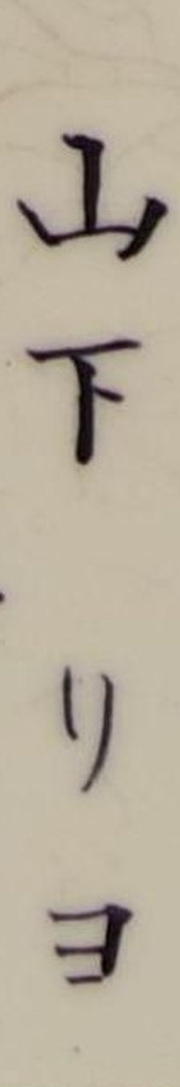山下リヨ
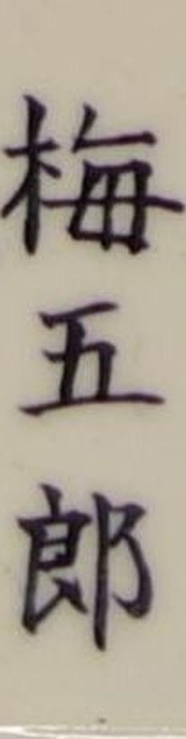梅五郎
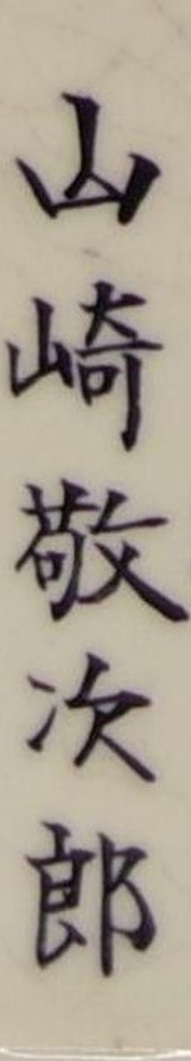山崎敬次郎
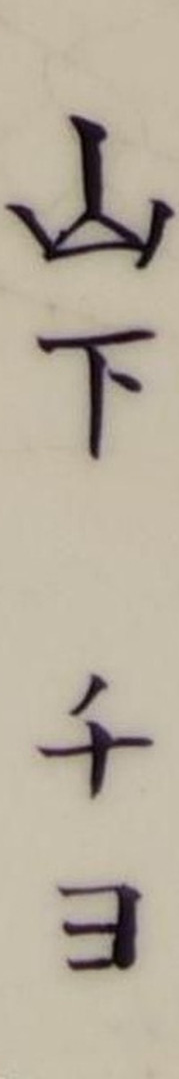山下リヨ
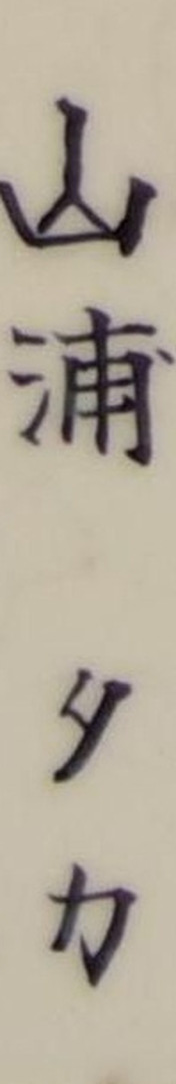山浦タカ
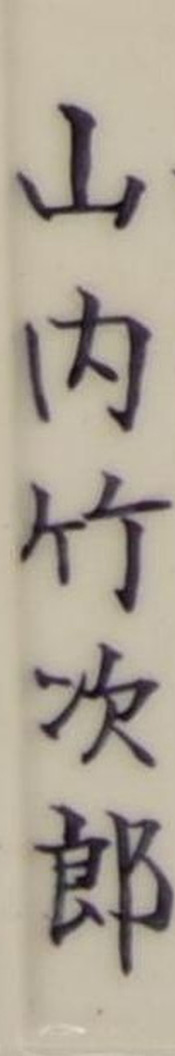山内竹次郎

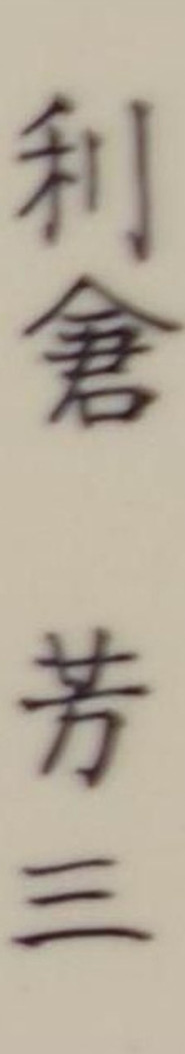利倉芳三
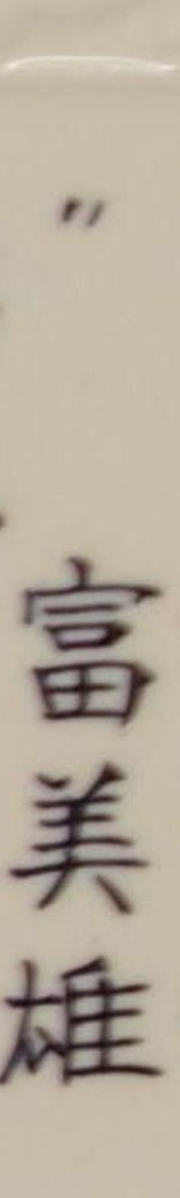富美雄
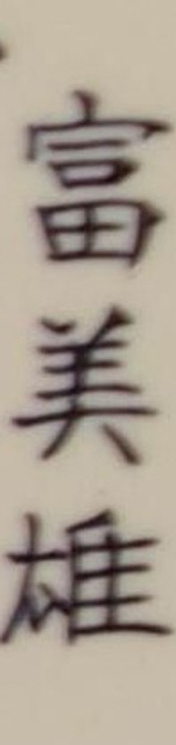富美雄
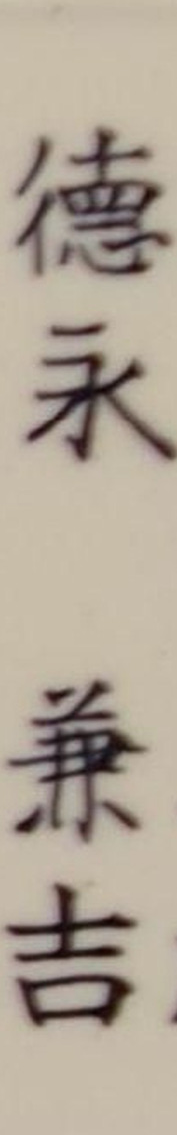徳永兼吉
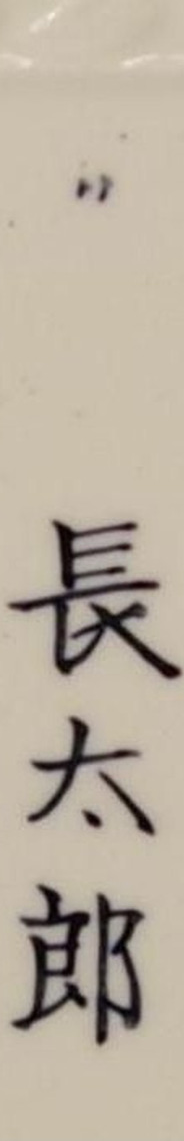長太郎
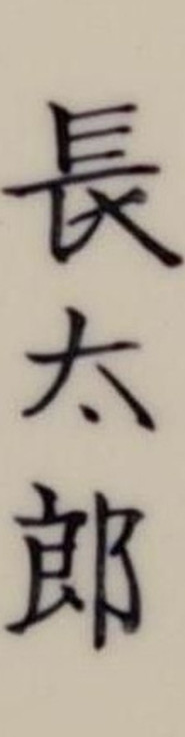長太郎
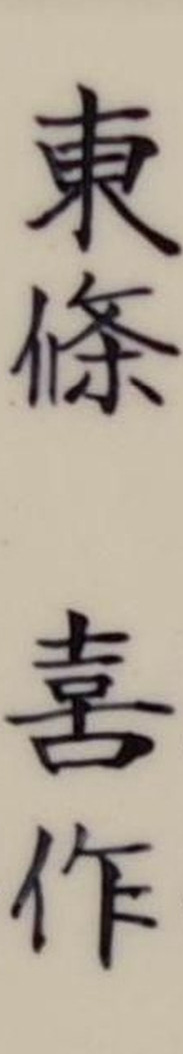東條喜作
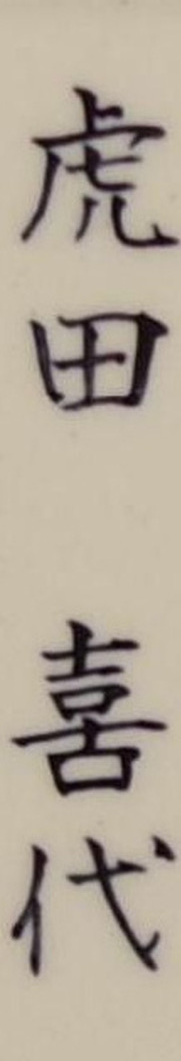虎田喜代
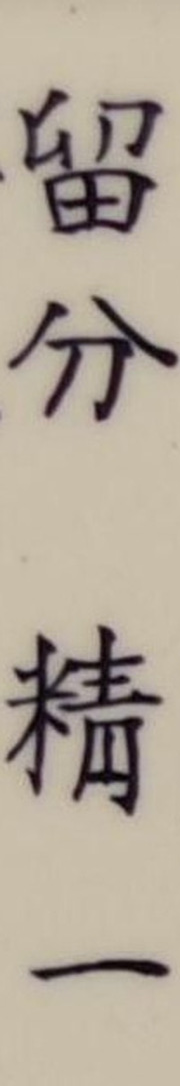留分精一

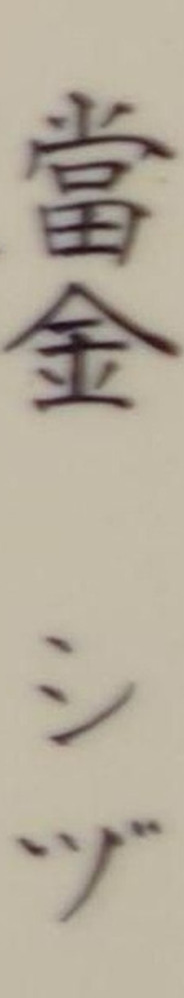當金シヅ
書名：M~S
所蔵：高野山金剛峯寺
